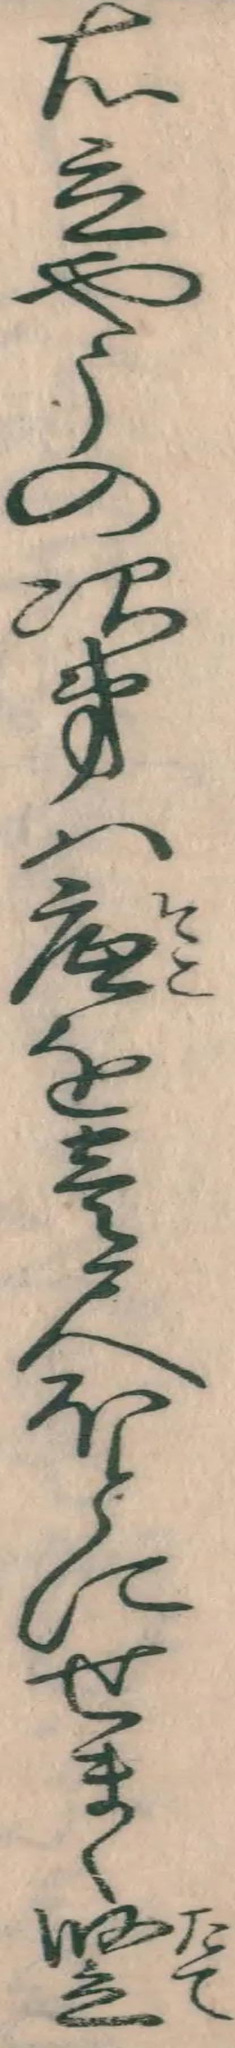右立やうの次第は底を壱尺ほとにせまく竪
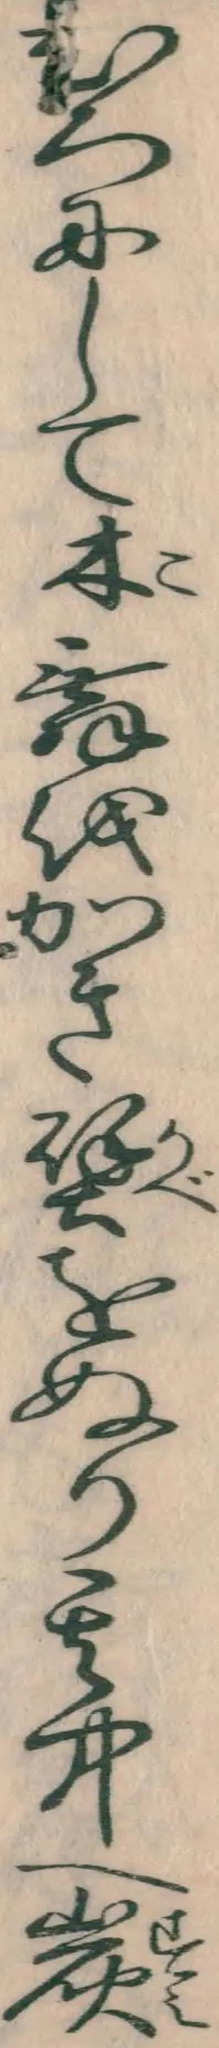ひろにして木舞をかき壁をぬり其中へ炭
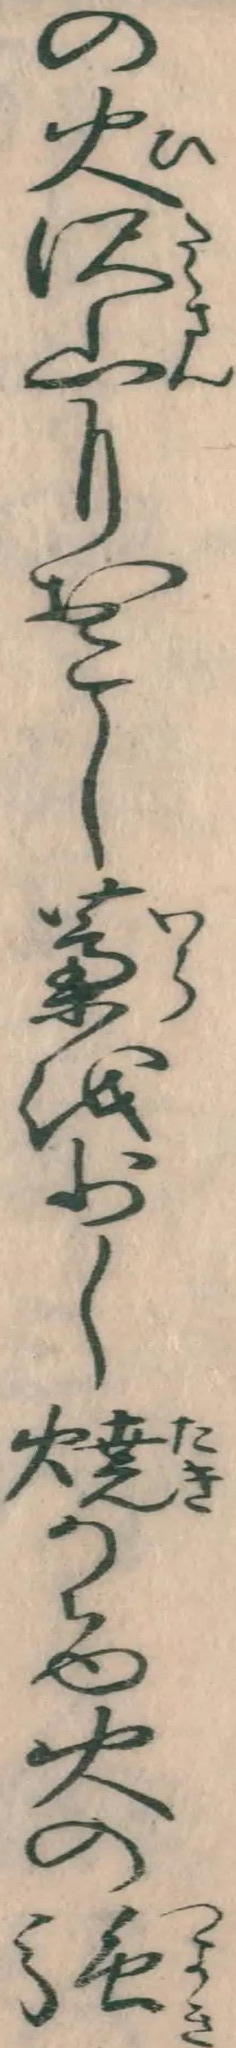の火沢山におこし藁を少し焼かけ火の強
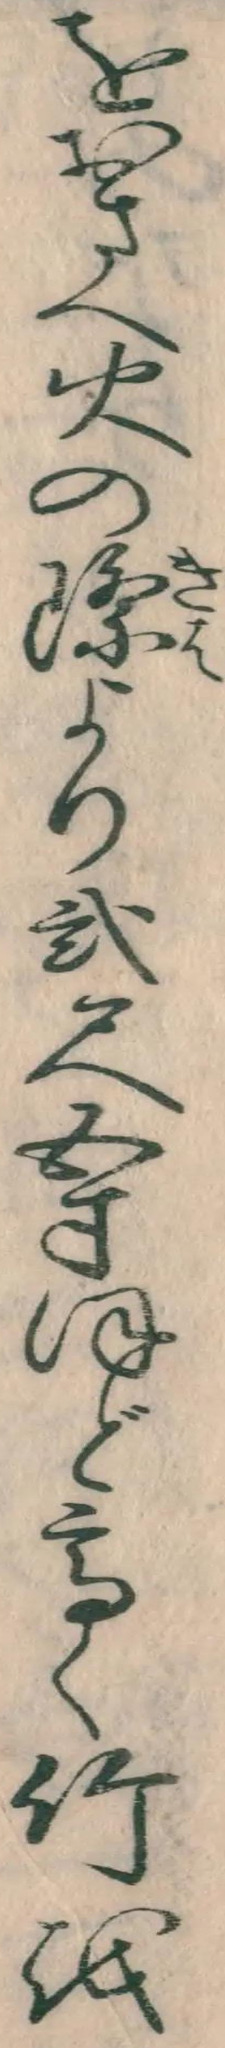をおさへ火の際より弐尺五寸ほど高く竹を
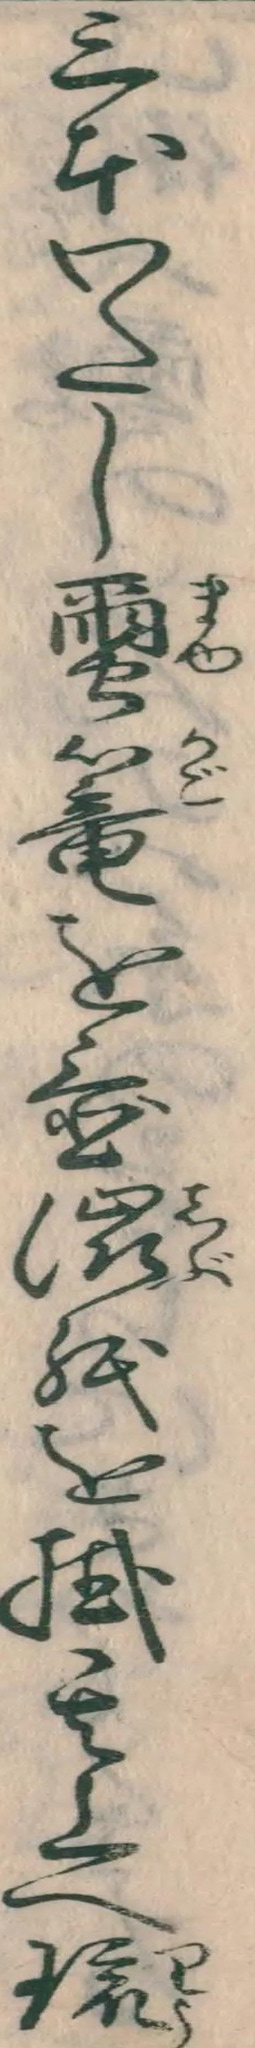三本わたし繭篭を置渋紙を掛其上へ琉
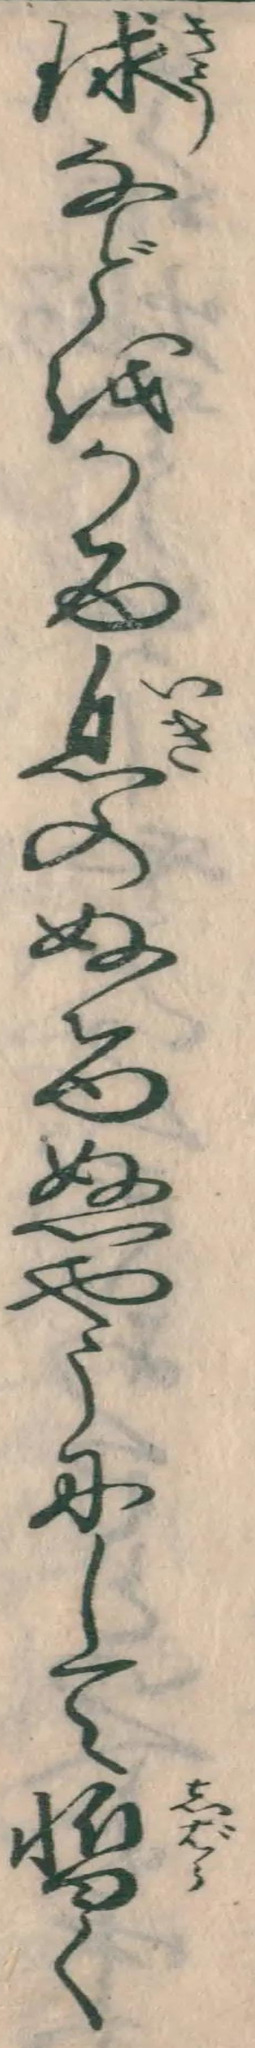球などをかけ息のぬけぬやうにして暫く
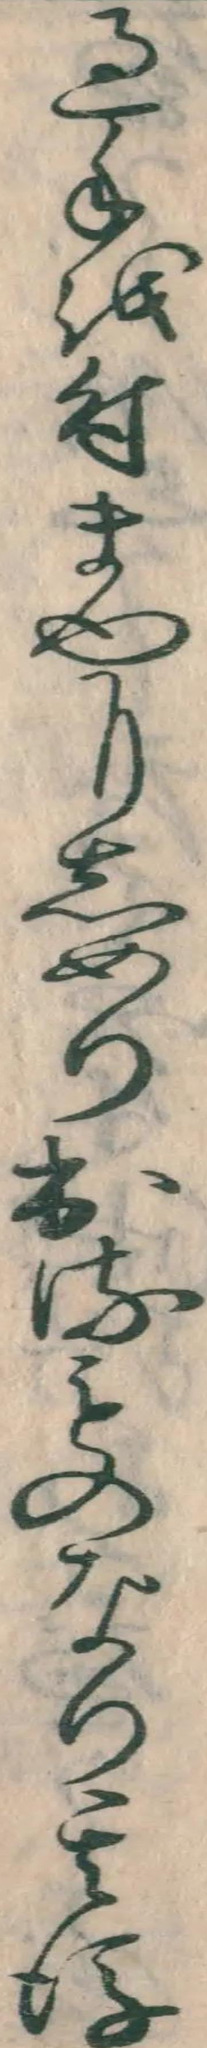過手を付まゆにしめり出るものなり其後
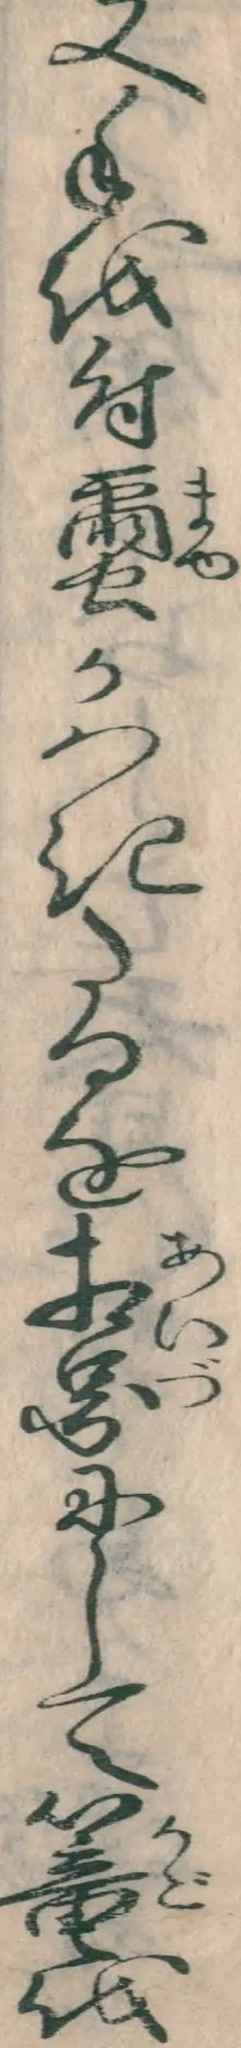又手を付繭かはきたるを相図にして篭を

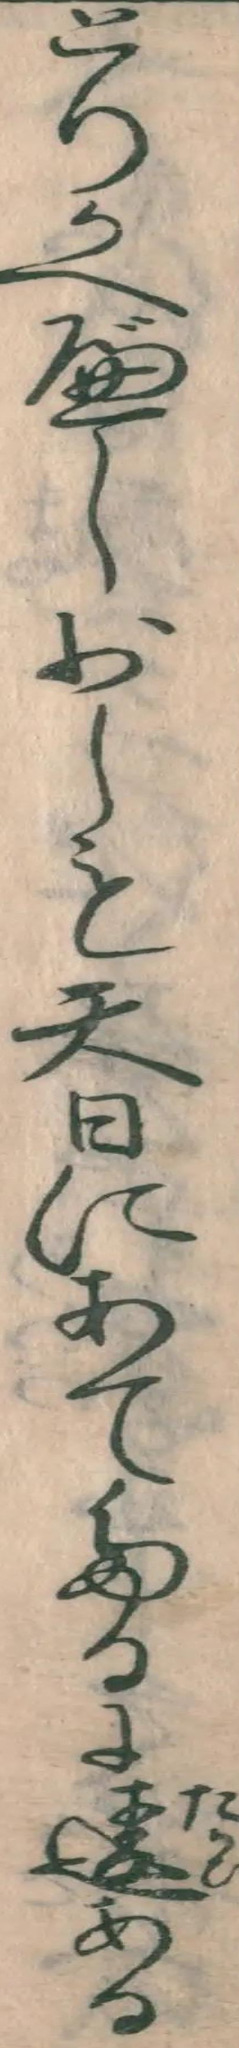とりかへべし少しも天日にあてたるに違ある
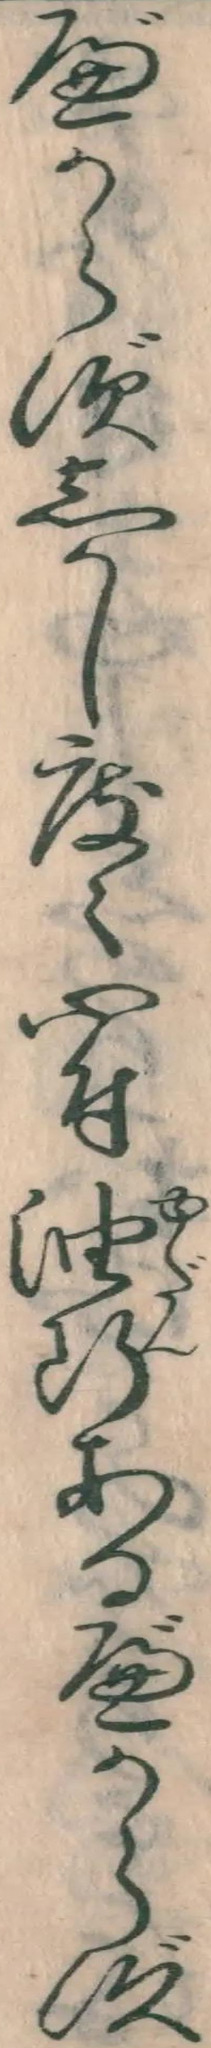べからずしかし度々心付油断あるべからず
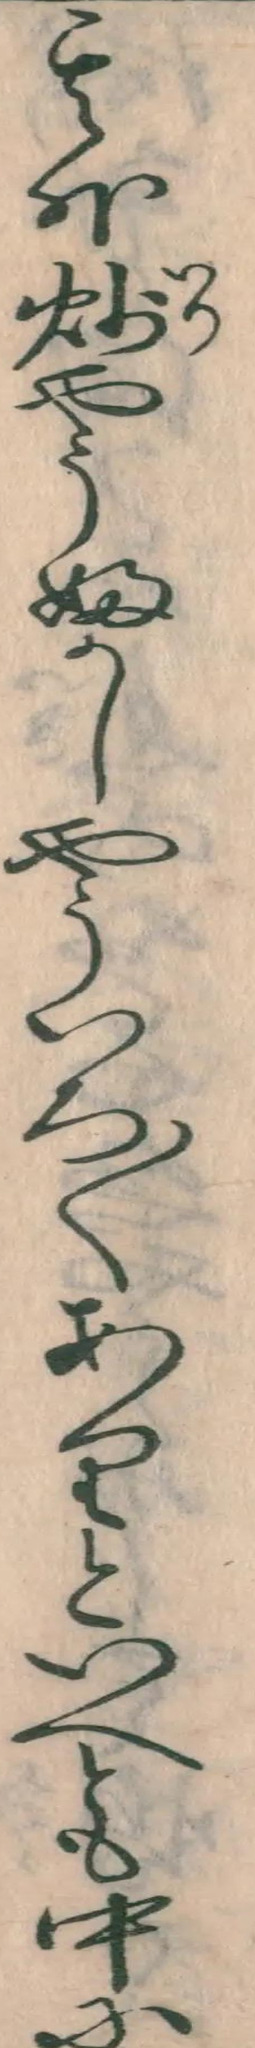其外炒やうふかしやういろ〳〵ありといへとも中に
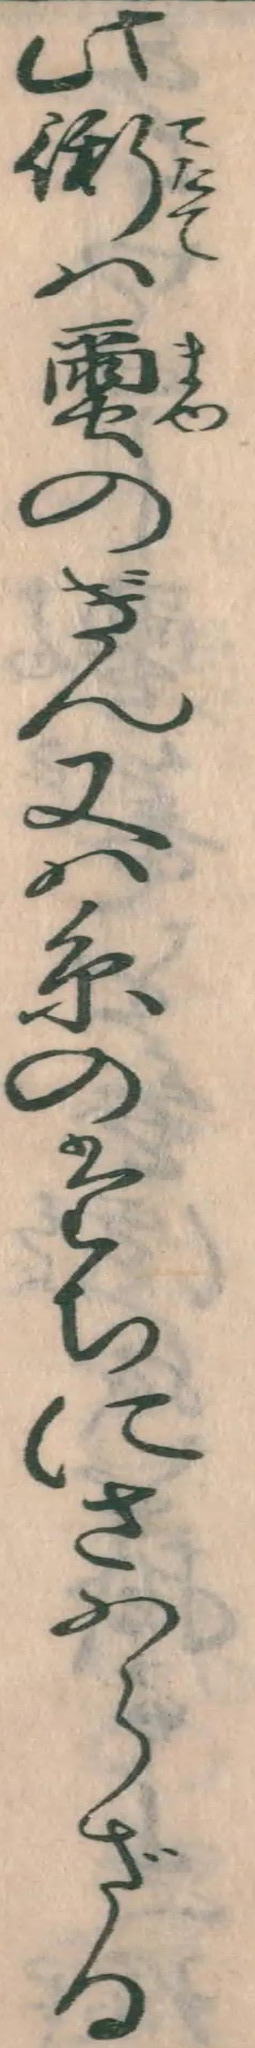此術は繭のぎん又は糸のたちにさはらざる
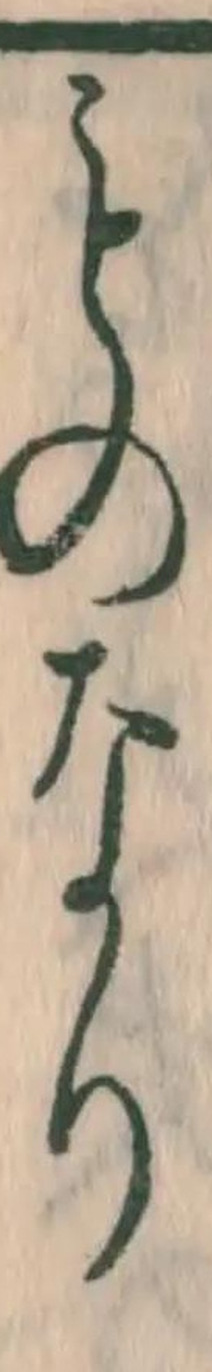ものなり
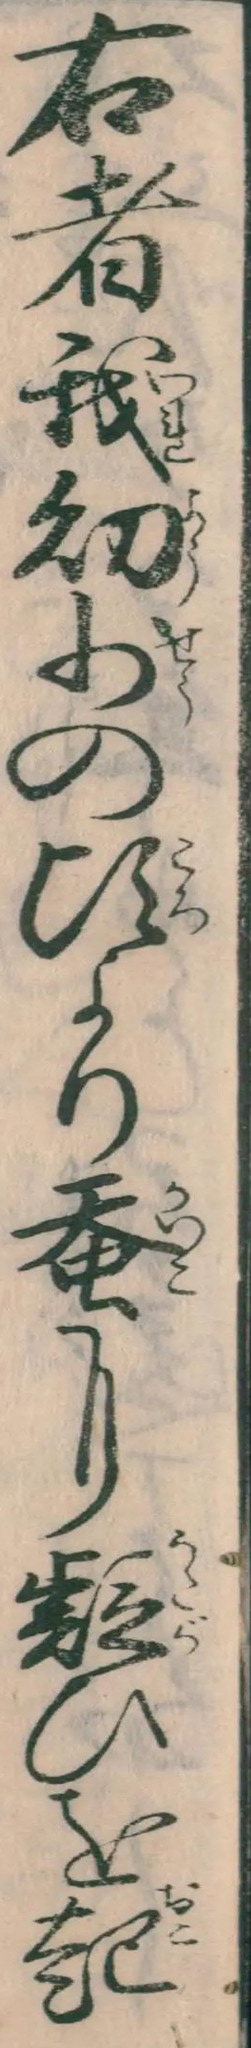右は我幼少の頃より蚕に疑ひを起
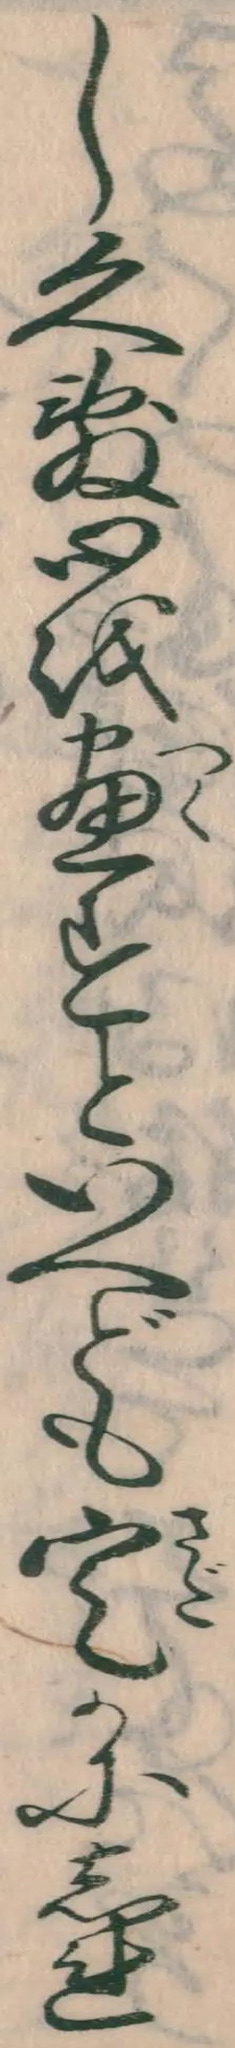し久敷心を尽すといへども定かにしれ
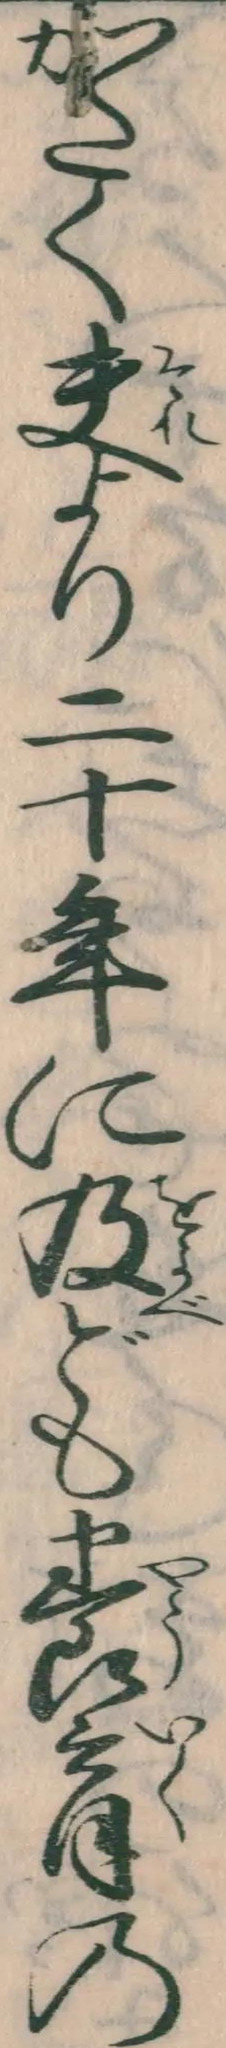かたく夫より二十年に及ども養育の
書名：新撰養蚕秘書
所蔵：国立国会図書館 National Diet Library, JAPAN
